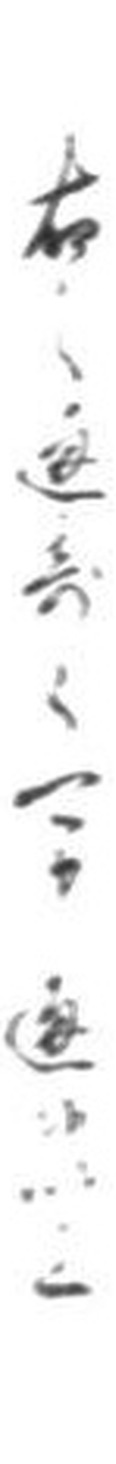右之通寄々可申通候以上
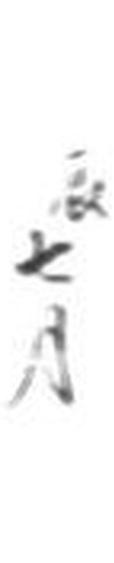辰七月
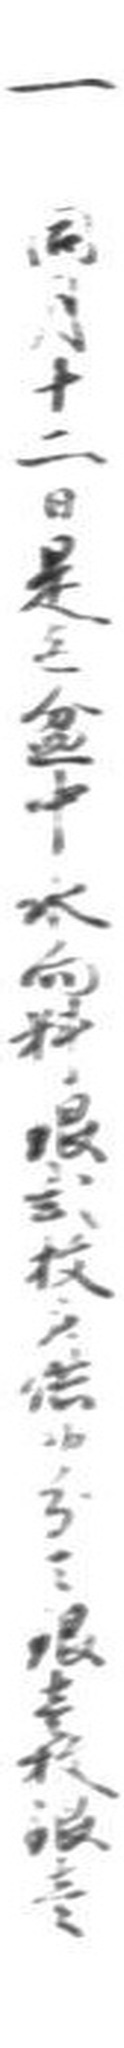一同月十二日是迄盆中水向両銀弐枚被供候分者銀壱枚銀壱
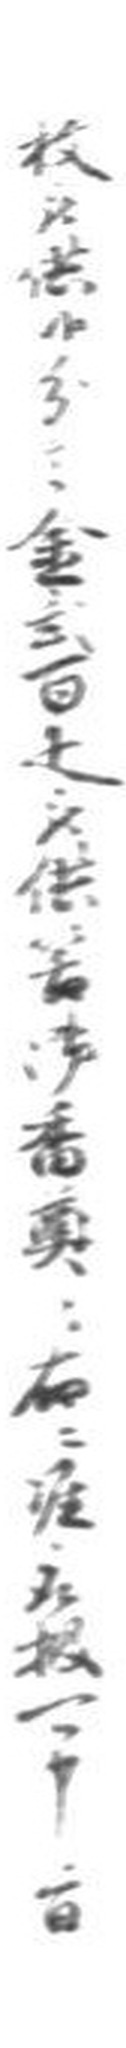枚被供候分者金弐百疋被供筈御香奠も右ニ准取扱可申旨
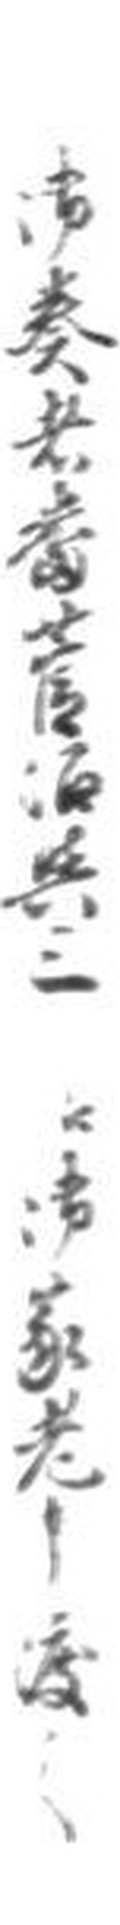御奏者番菅沼与三江御家老申渡之
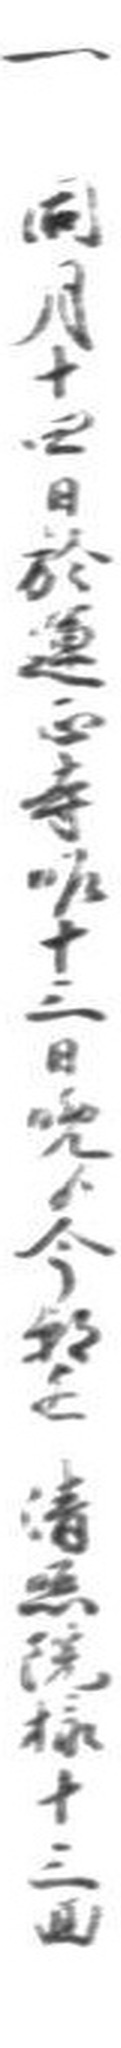一同月十四日於運正寺昨十三日晩ゟ今朝迄清照院様十三回
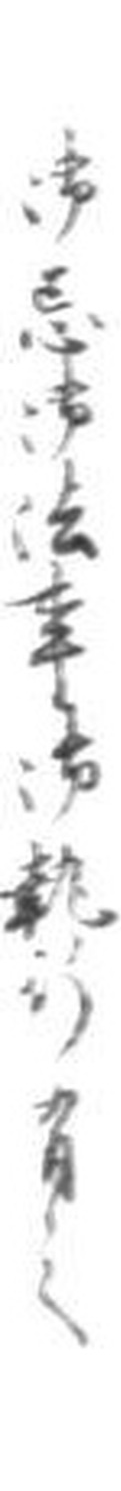御忌御法事御執行有之

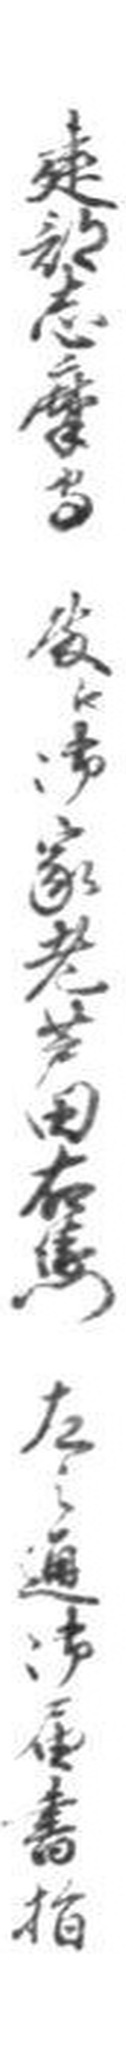建部志摩守殿江御家老芦田右衛門左之通御届書被指
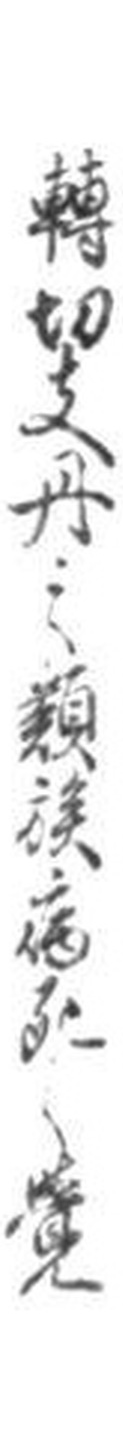転切支丹之類族病死之覚
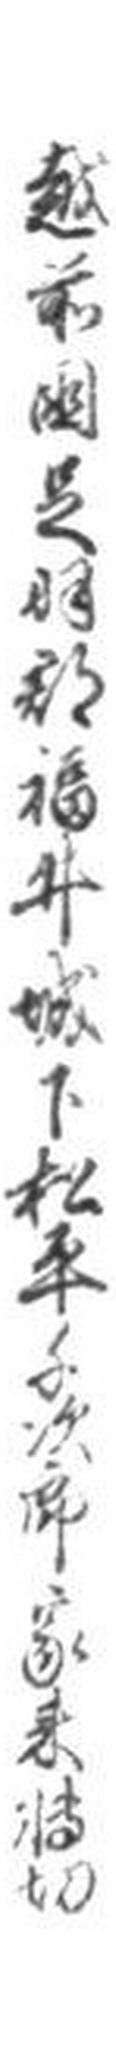越前国足羽郡福井城下松平千次郎家来転切
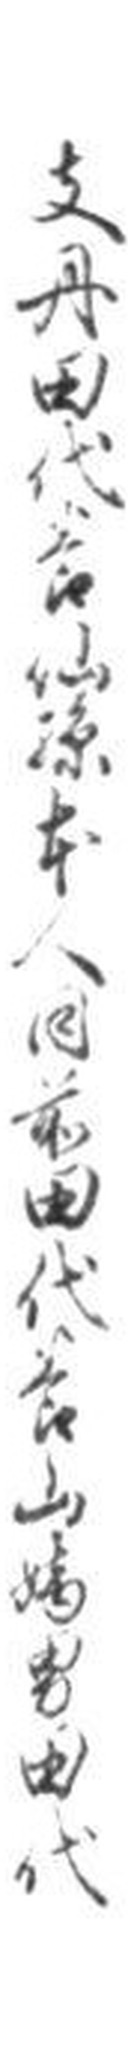支丹田代養仙孫本人同前田代養山嫡男田代
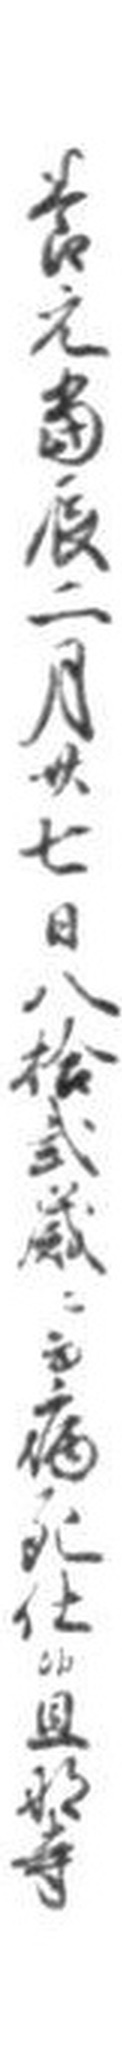養元当辰二月廿七日八拾弐歳ニ而病死仕候旦那寺
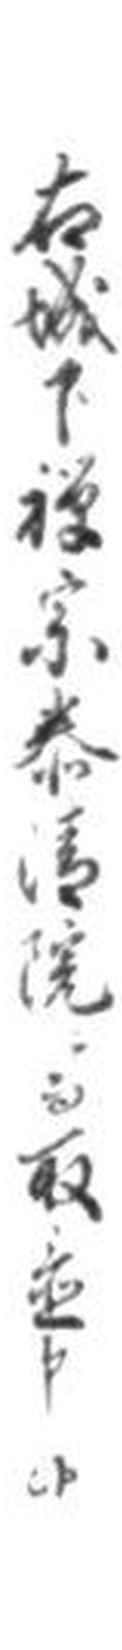右城下禅宗泰清院ニ而取置申候
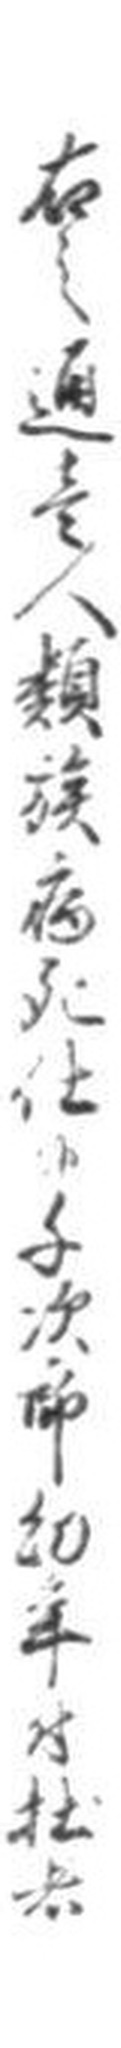右之通壱人類族病死仕候千次郎幼年付拙者
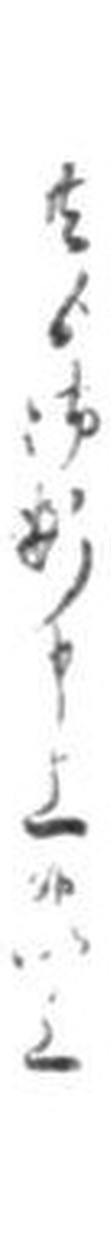共ゟ御断申上候以上
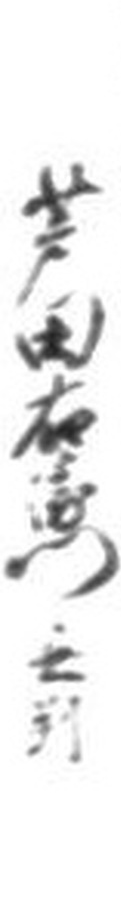芦田右衛門無判
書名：家譜 三十八 宗矩公 従享保九年五月到享保九年十二月
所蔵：福井県文書館 Fukui Prefectural Archives
